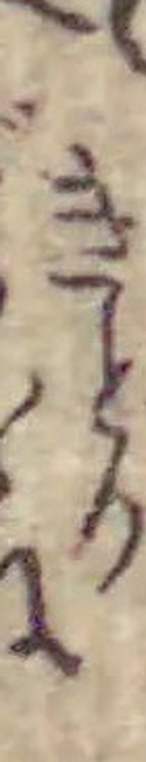きどり
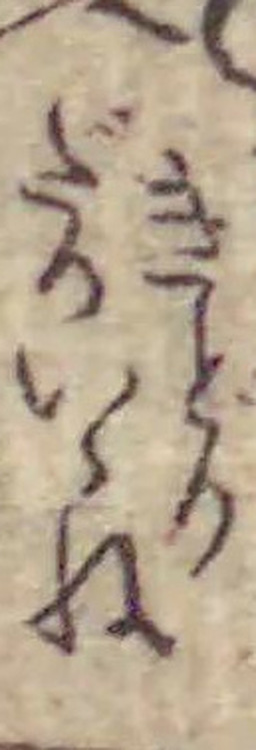だかいゝね

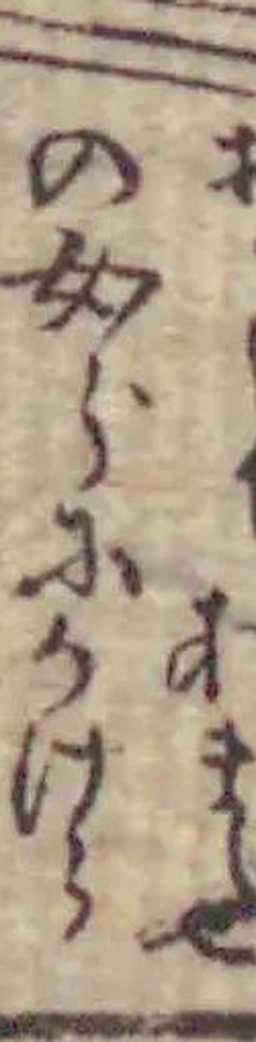の女郎にかけら
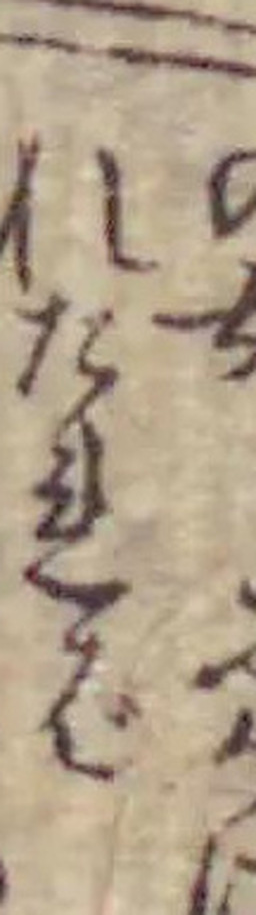れたれば
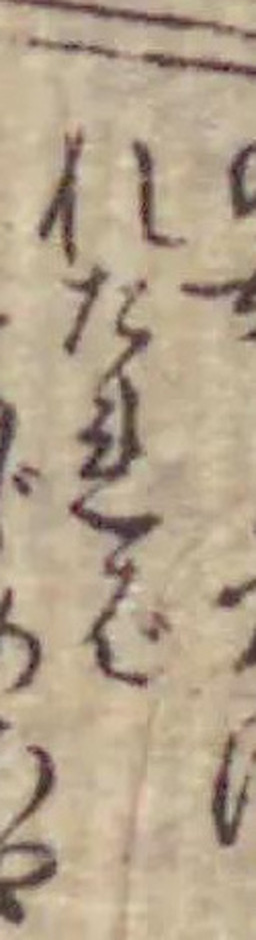れたれば
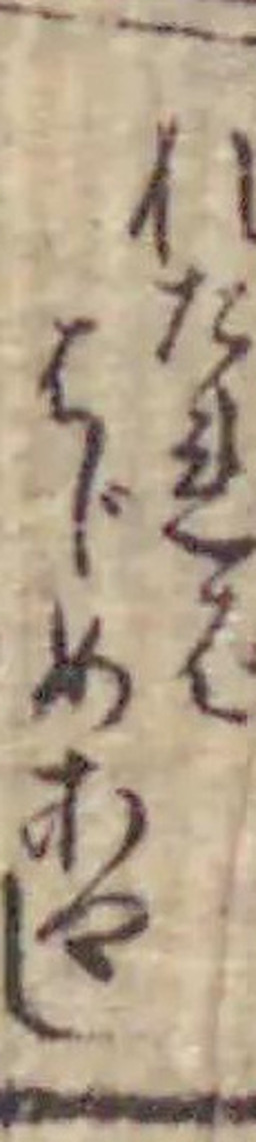はじめあやし
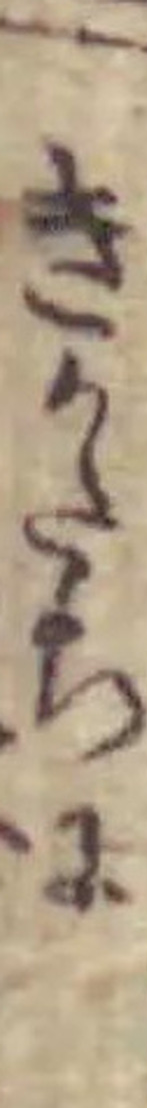きかたちに
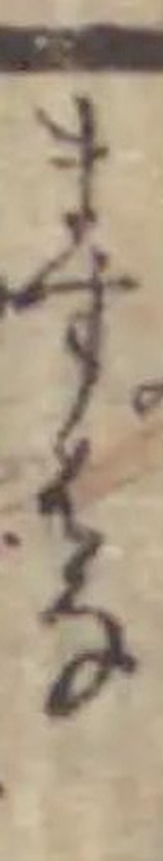ますはな
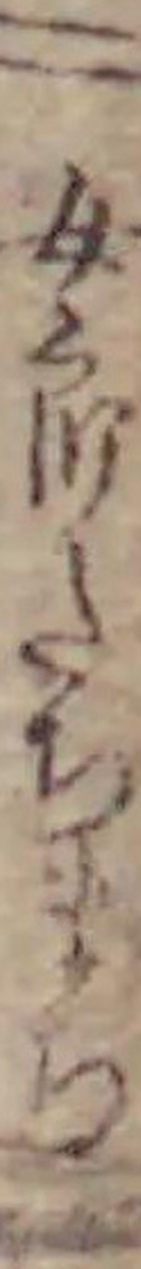女郎たちまち
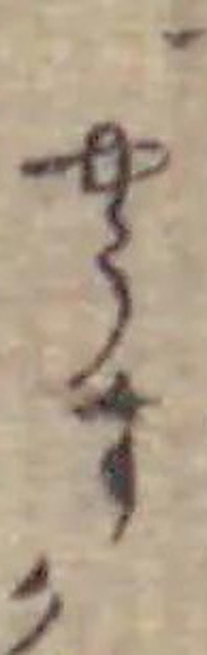やふす
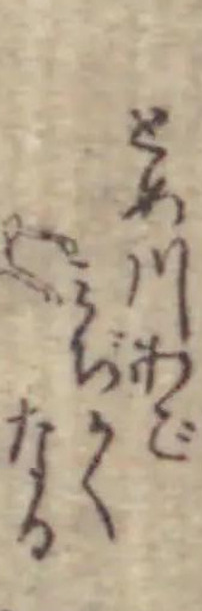とめ川あご
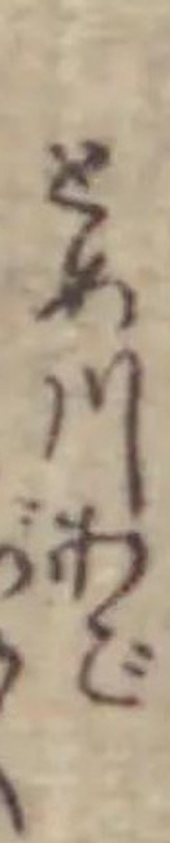とめ川あご
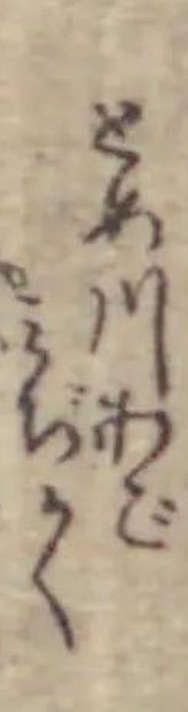とめ川あご
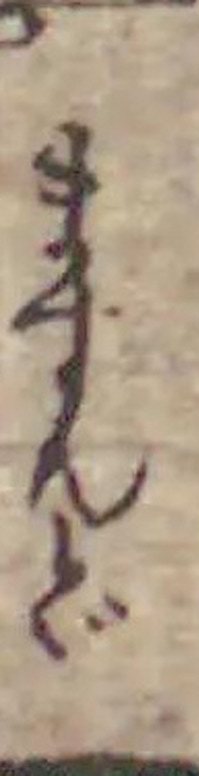ますんど
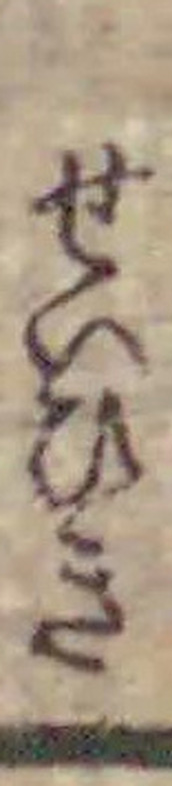せいひき
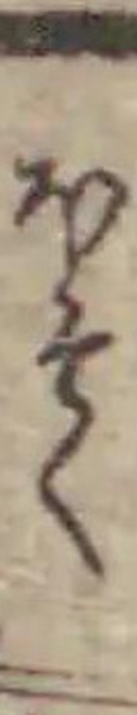ほそく
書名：亀山人家妖 3巻
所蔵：国立国会図書館 National Diet Library, JAPAN
